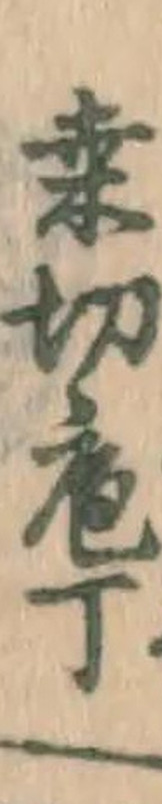桑切庖丁
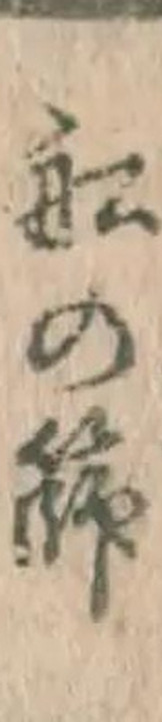船の篩

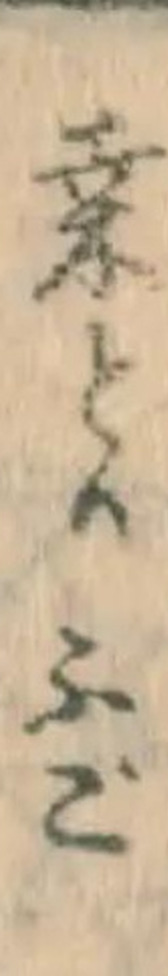葉とりふご
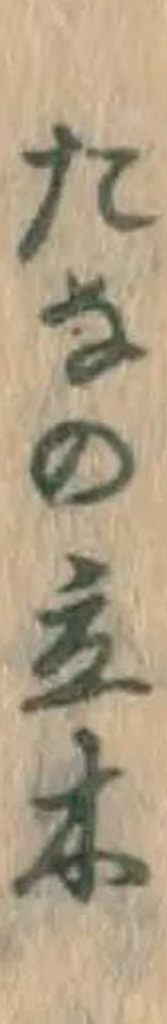たなの立木
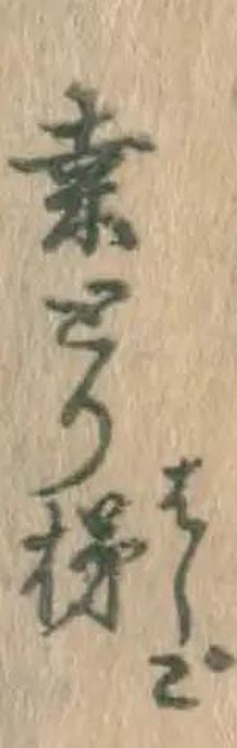桑とり梯
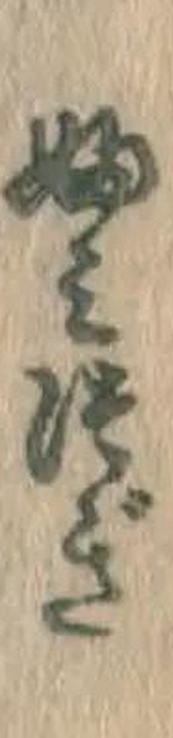ふみつぎ

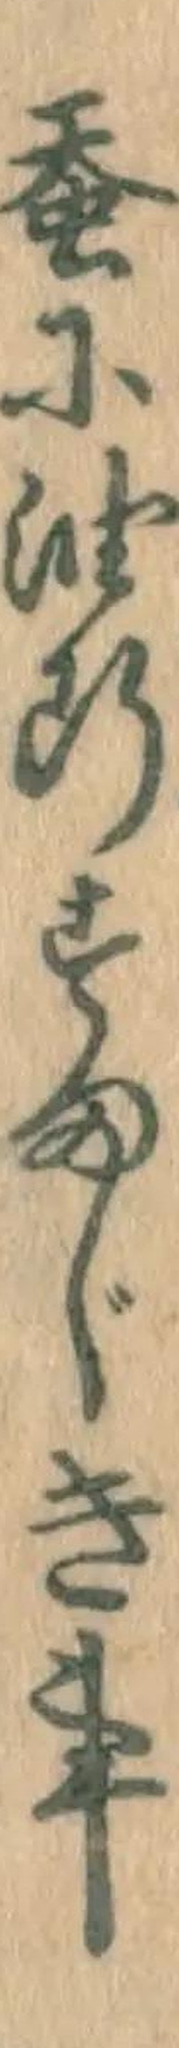蚕に油断すまじき事
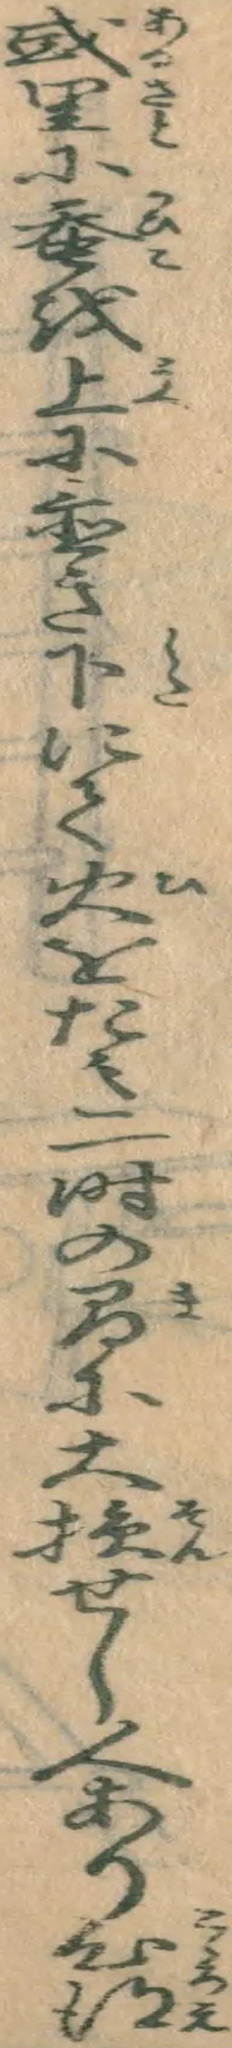或里に蚕を上に置き下にて火をたき一時の間に大損せし人あり心得
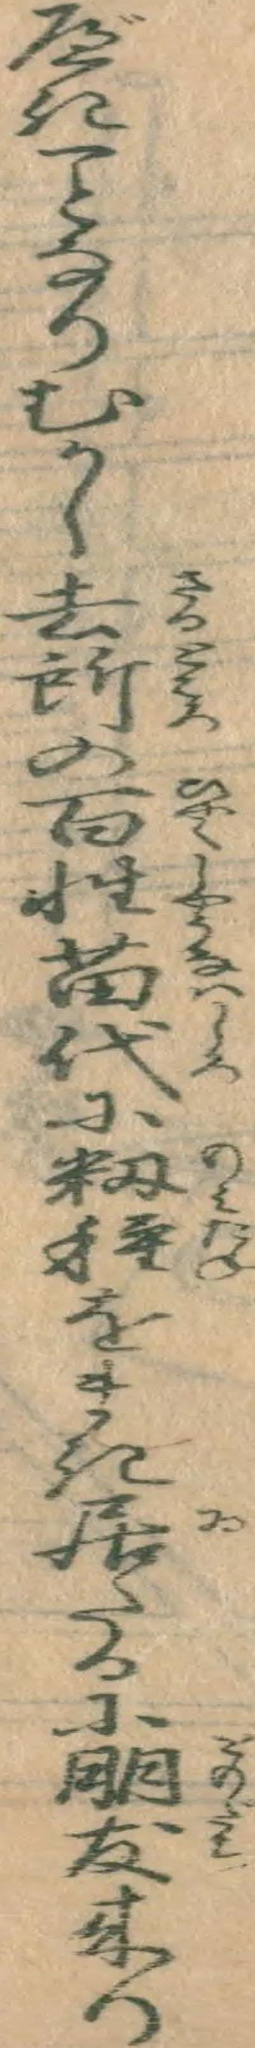べきことなりむかし去所の百性苗代に籾種をまき居たるに朋友来り
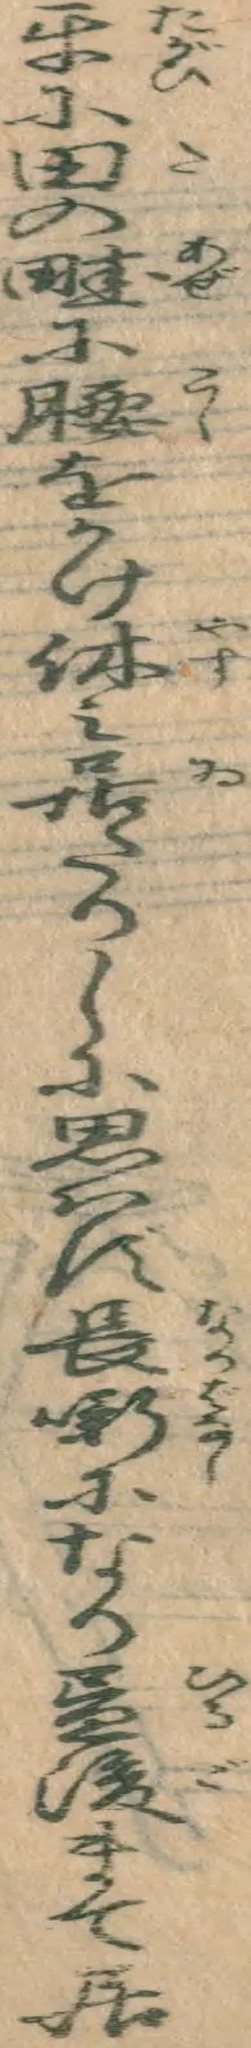互に田の畦に腰をかけ休み居たりしに思はず長噺になり昼後まて居
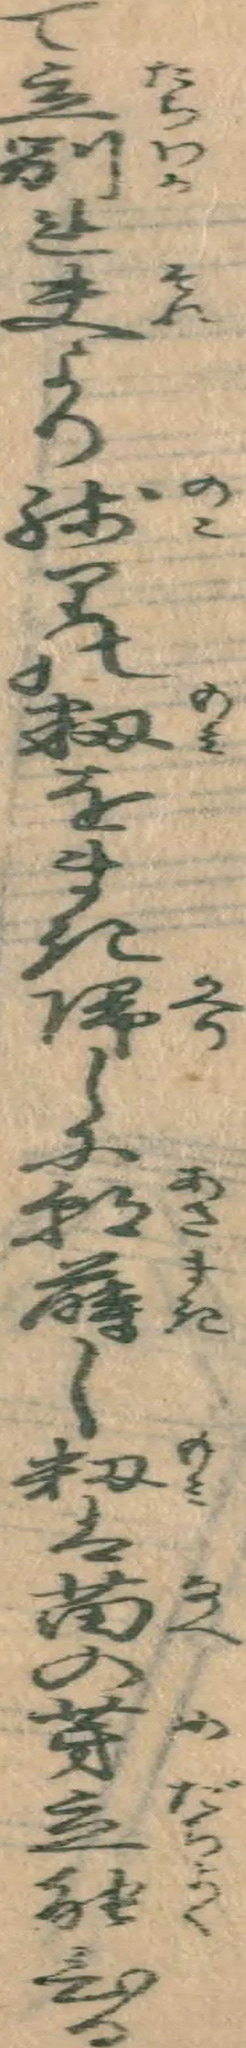て立別れ夫より残りの籾をまき帰しに朝蒔し籾は苗の芽立能ひる
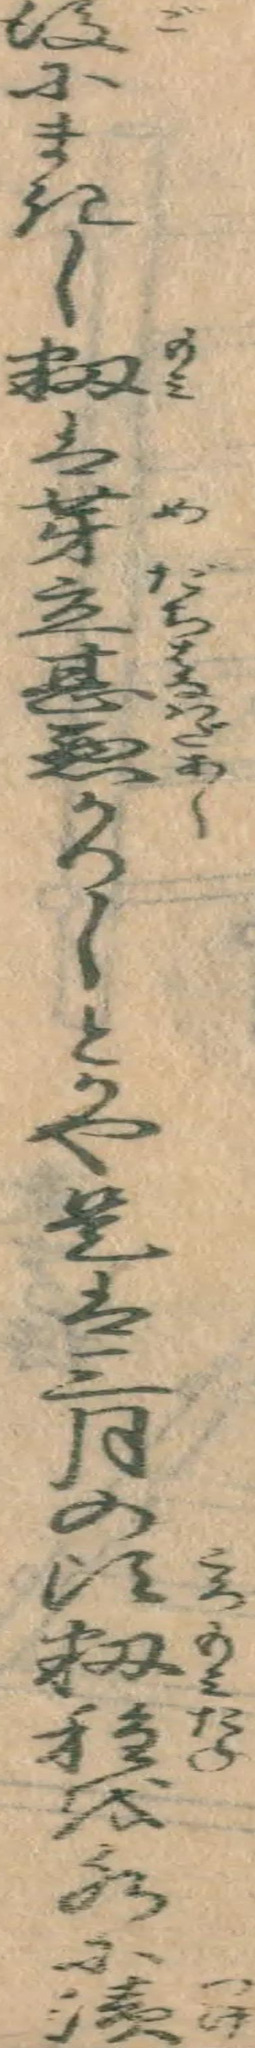後にまきし籾は芽立甚悪かりしとかや是は三月の頃籾種を水に潰
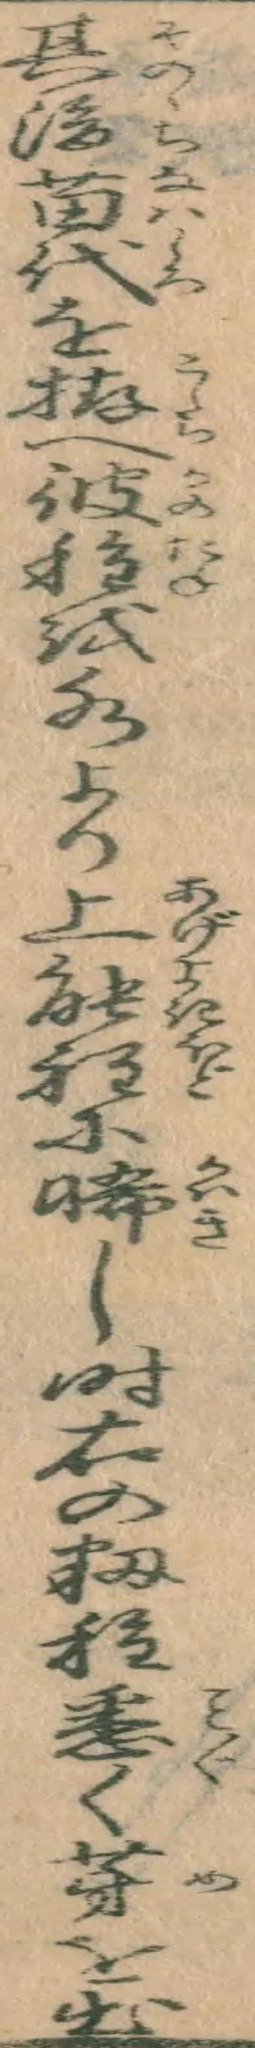其後苗代を拵へ彼種を水より上能程に晞し時右の籾種悉く芽を出
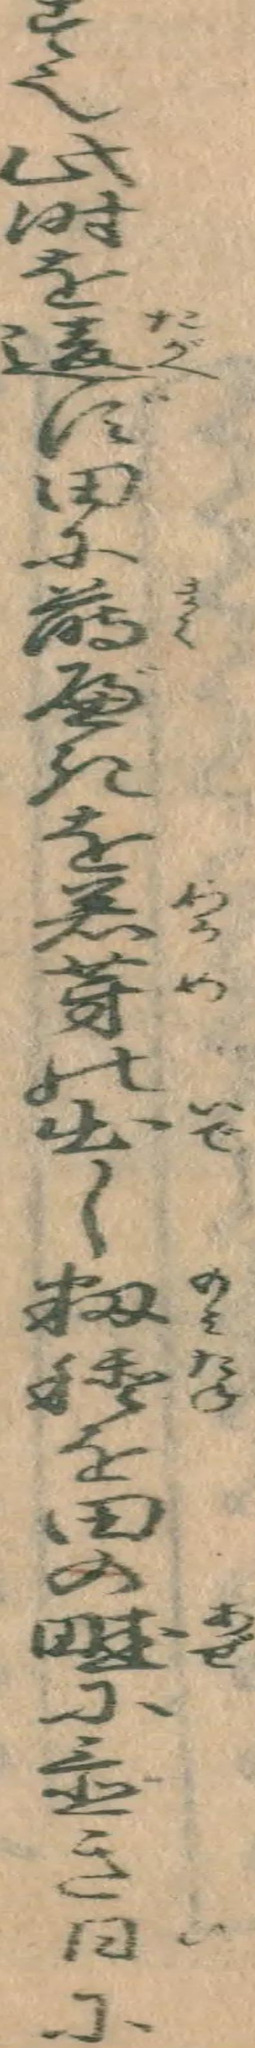す也此時を違ず田に蒔べきを若芽の出し籾種を田の畦に置き日に
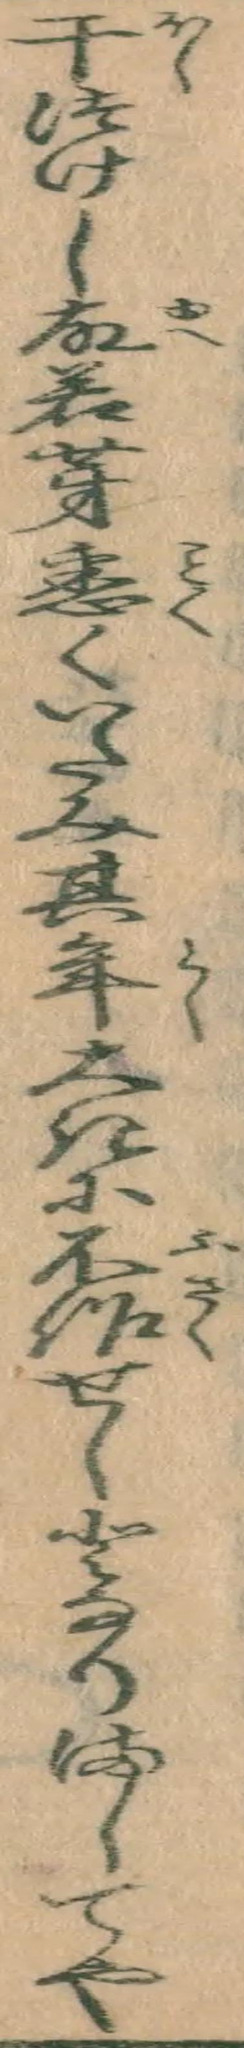干つけし故若芽悉くいたみ其年大きに不作せしとなりましてや
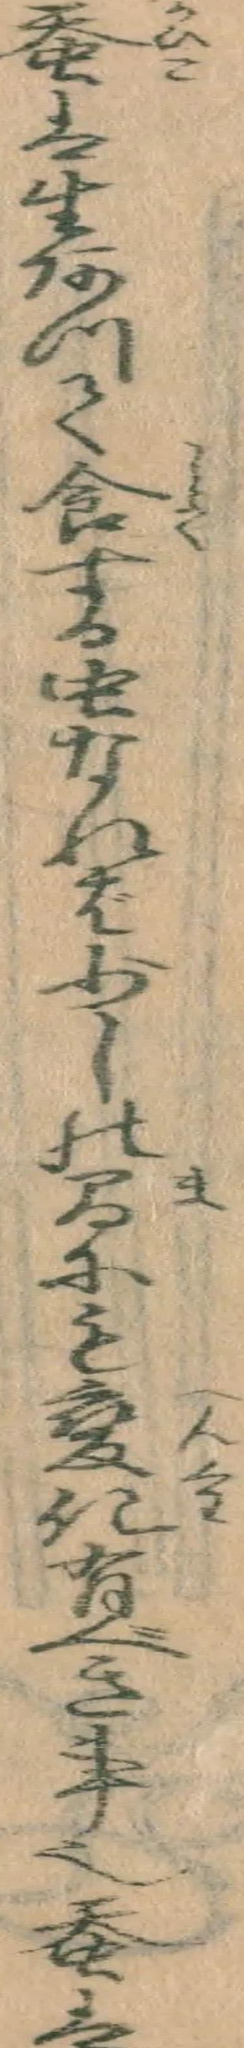蚕は生あつて食する虫なれば少しの間にも変化有べき事也蚕は
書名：養蚕秘録 3巻. [1]
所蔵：国立国会図書館 National Diet Library, JAPAN
